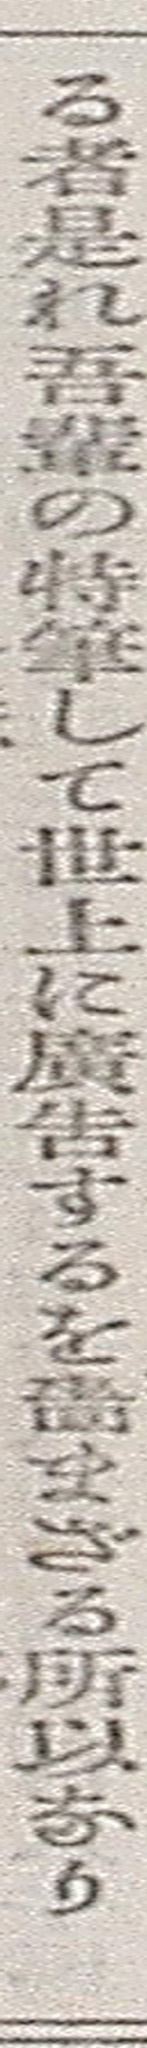る者是れ吾輩の特筆して世上に広告するを嗇まざる所以なり
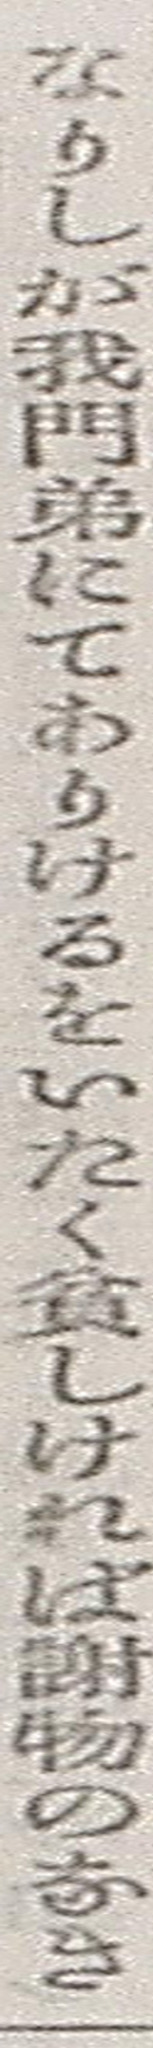なりしが我門弟にてありけるをいたく貧しければ謝物のなき
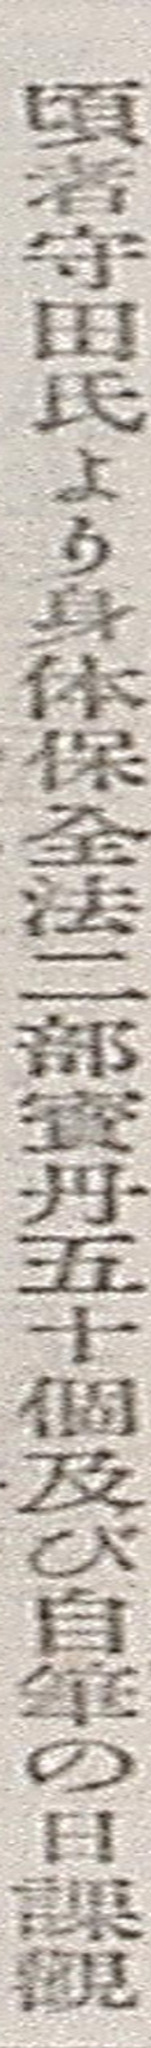頃者守田氏より身体保全法ニ部宝丹五十個及び自筆の日課観
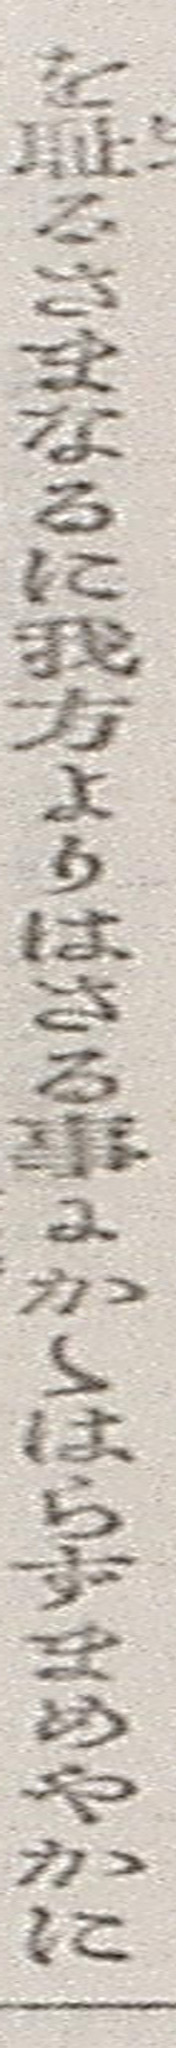を耻るさまなるに我方よりはさる事にかゝはらずまめやかに
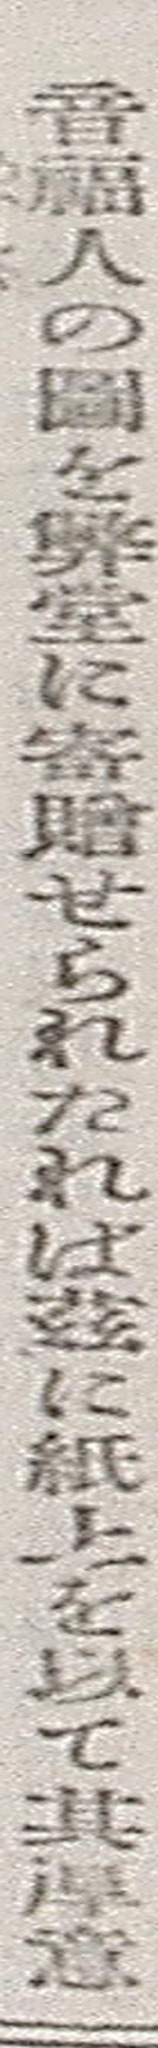音福人の図を弊堂に寄贈せられたれば茲に紙上を以て其厚意
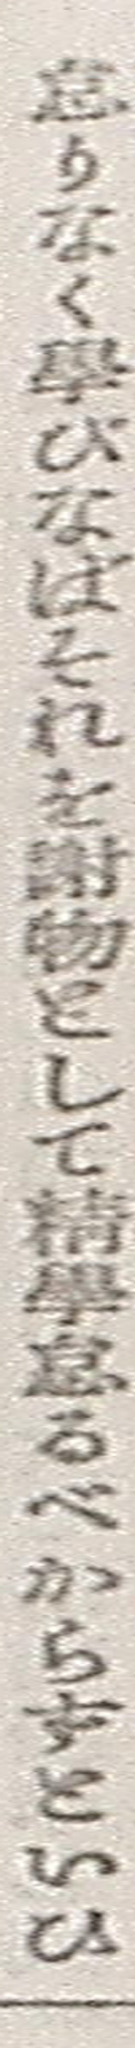怠りなく学びなばそれを謝物として精学怠るべからずといひ
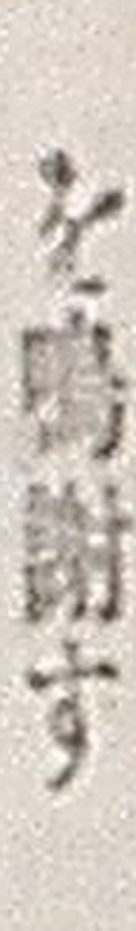を鳴謝す
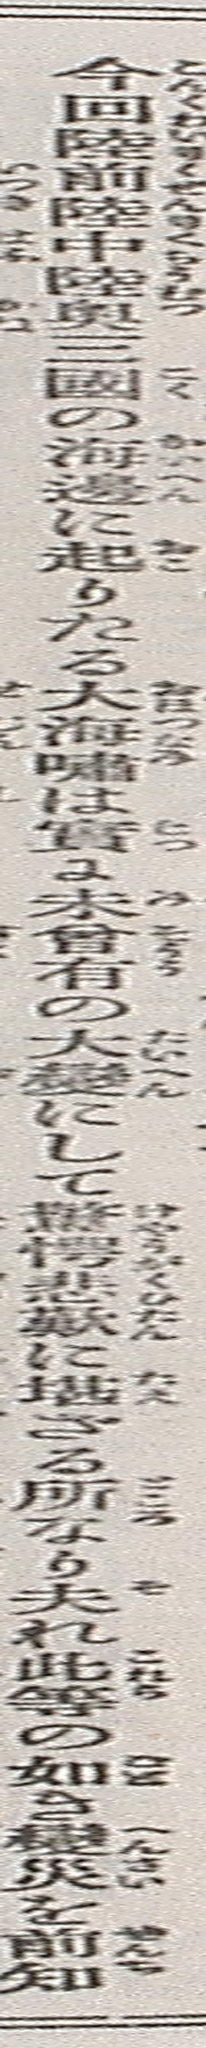今回陸前陸中陸奥三国の海辺に起りたる大海嘯は実に未曽有の大変にして驚愕悲歎に堪ざる所なり夫れ此等の如き変災を前知
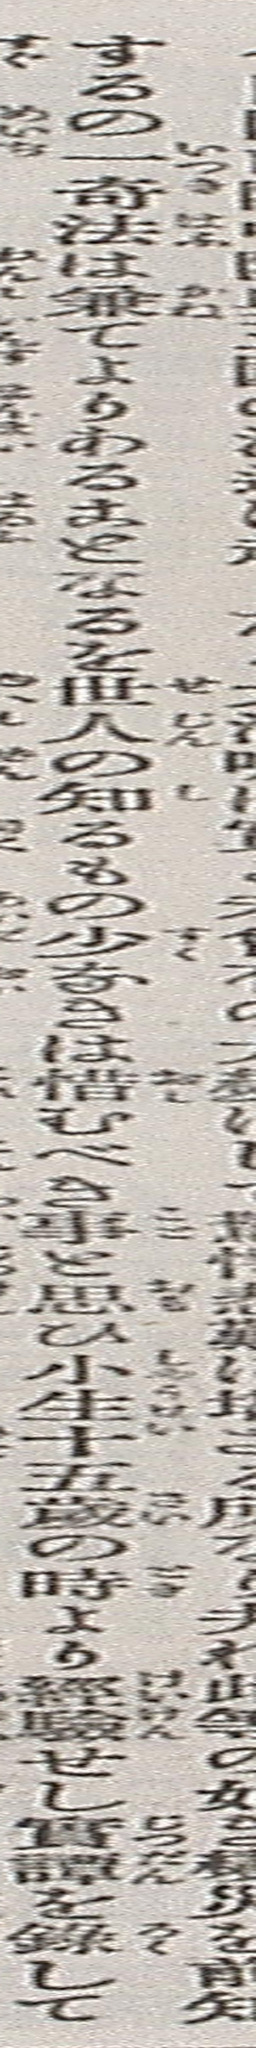するの一奇法は兼てよりあることなるを世人の知るもの少なきは惜むべき事と思ひ小生十五歳の時より経験せし実譚を録して
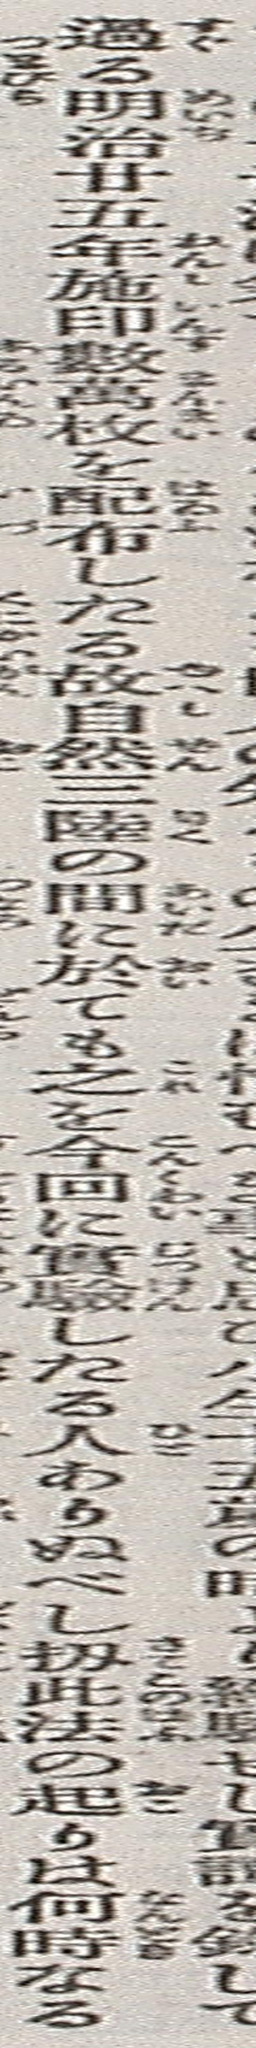過る明治廿五年施ねんし印数万枚を配布したる故自然三陸の間に於ても之を今回に実験したる人ありぬべし扨此法の起りは何時なる
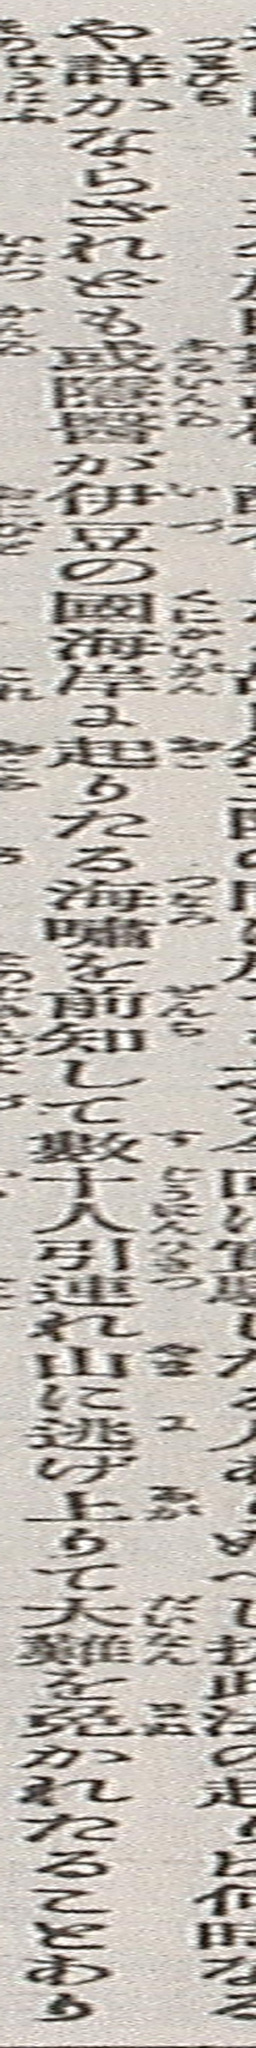や詳かならざれども或隠医が伊豆の国海岸に起りたる海嘯を前知して数十人引連れ山に逃げ上りて大難を免かれたることあり
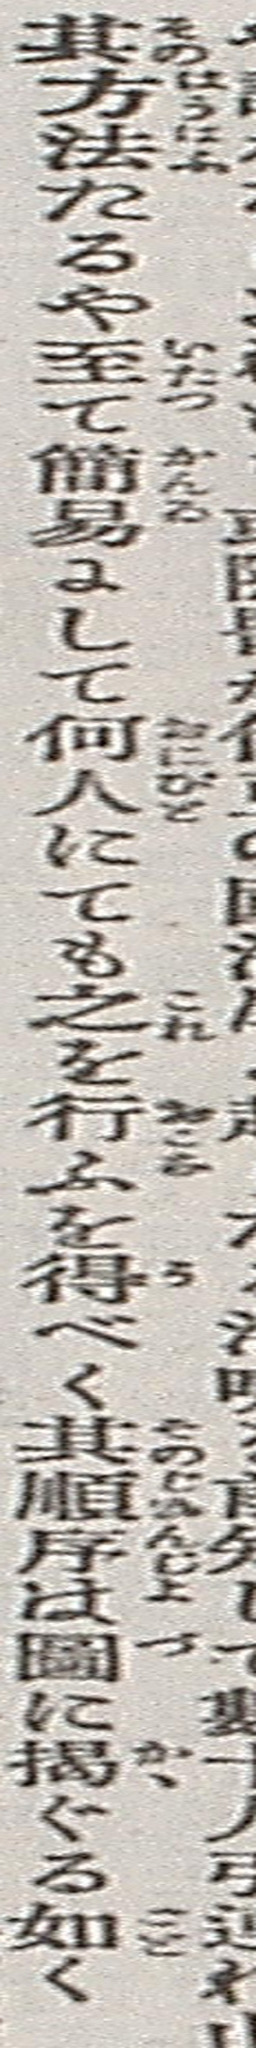其方法たるや至て簡易にして何人にても之を行ふを得べく其順序は図に掲ぐる如く
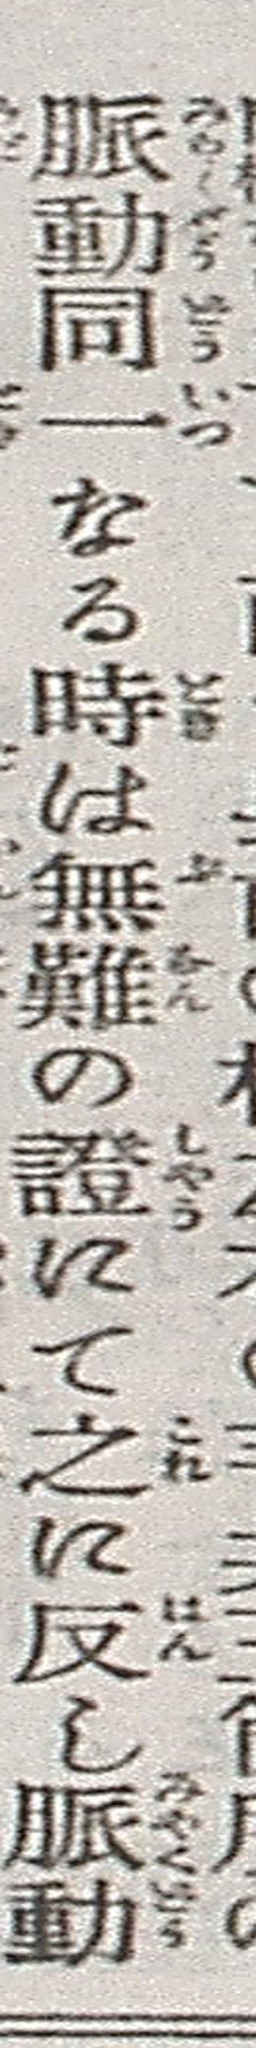脈動同一なる時は無難の証にて之に反し脈動
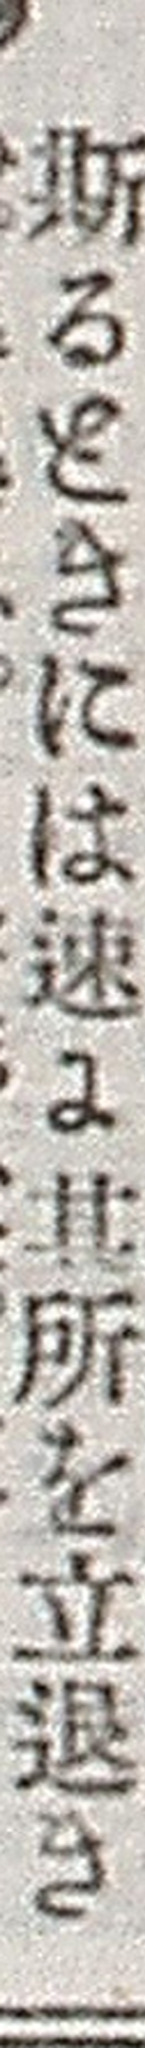斯るときには速に其所を立退き
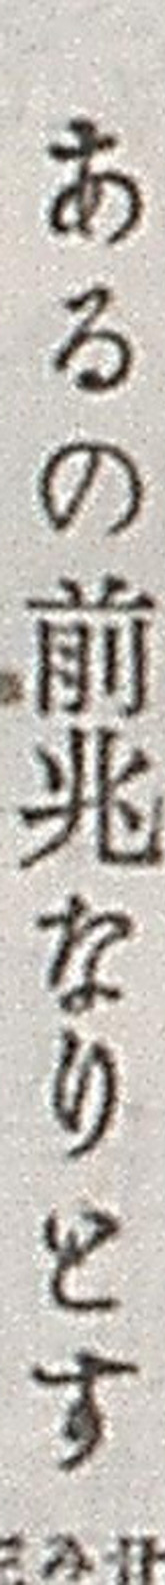あるの前兆なりとす
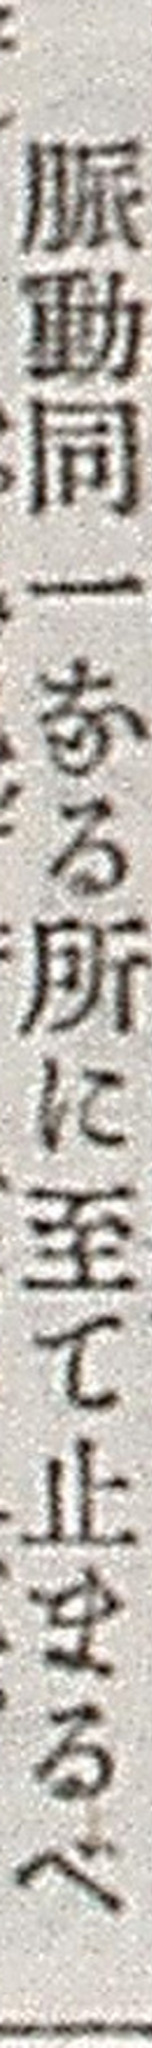脈動同一なる所に至て止まるべ
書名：風俗畫報臨時増刊第百二十號　大海嘯被害録（下）
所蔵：東京大学地震研究所図書室 Earthquake Research Institute Library, The University of Tokyo, JAPAN
